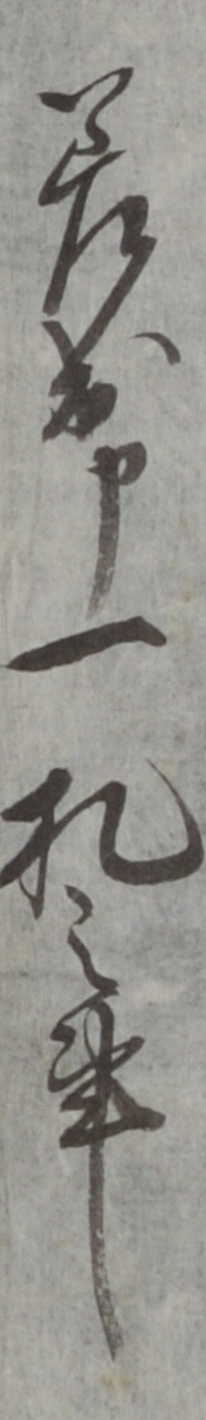差出申一札之事
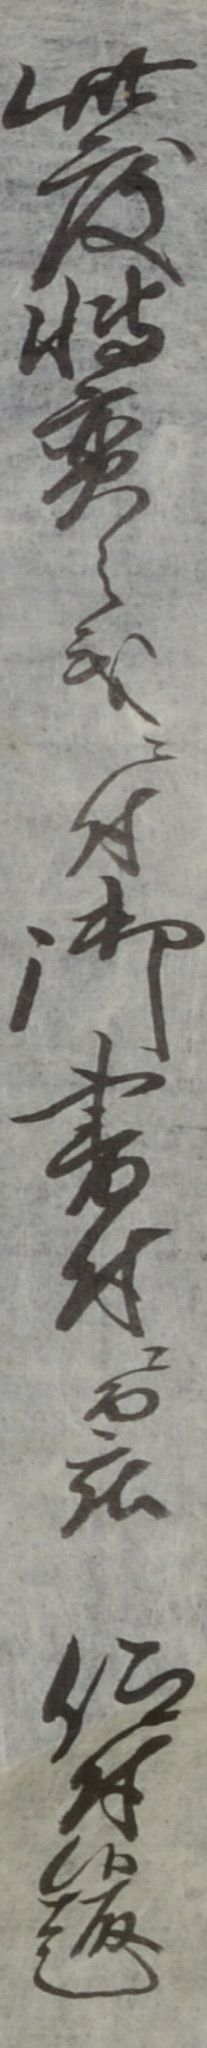此度博奕之義ニ付御書付ニて被仰付候趣
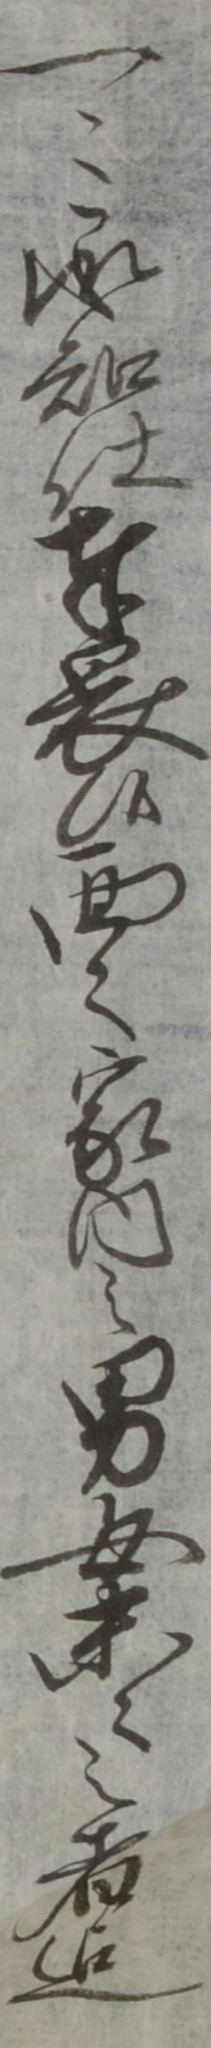可承知仕奉畏候面々家内之男女末々之者迄
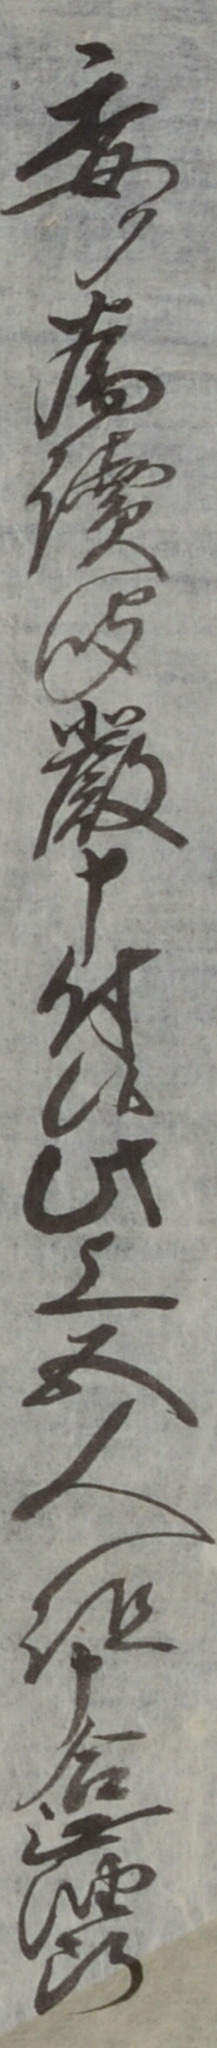委ク為読聞厳申付候此上五人組申合無油断
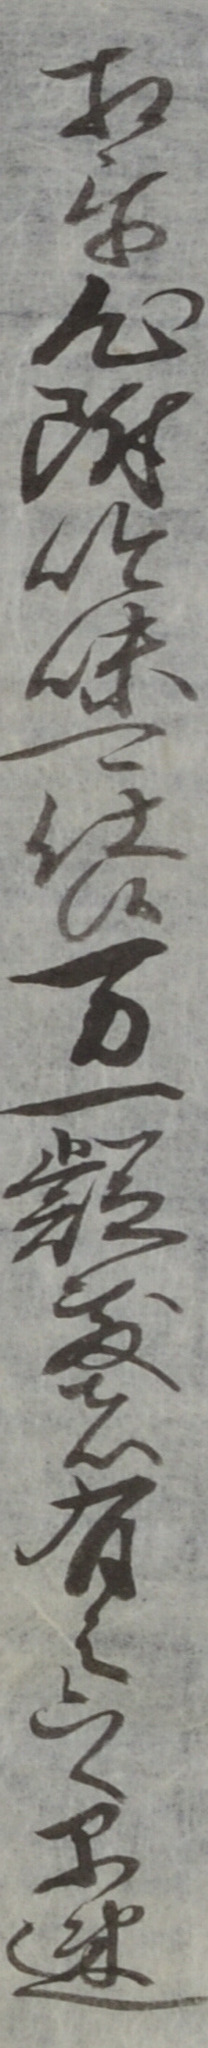相互心付吟味可仕候万一疑敷者有之候ハヽ早速
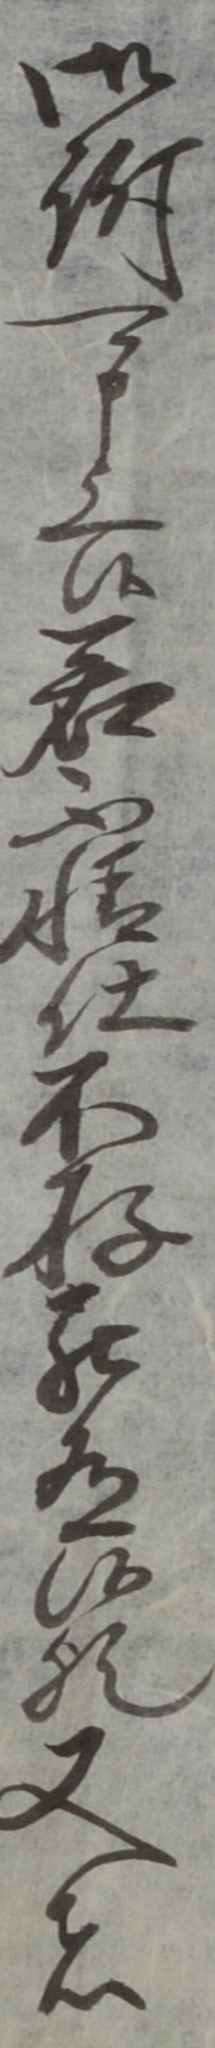御訴可申上候若不情仕不存罷有候歟又者
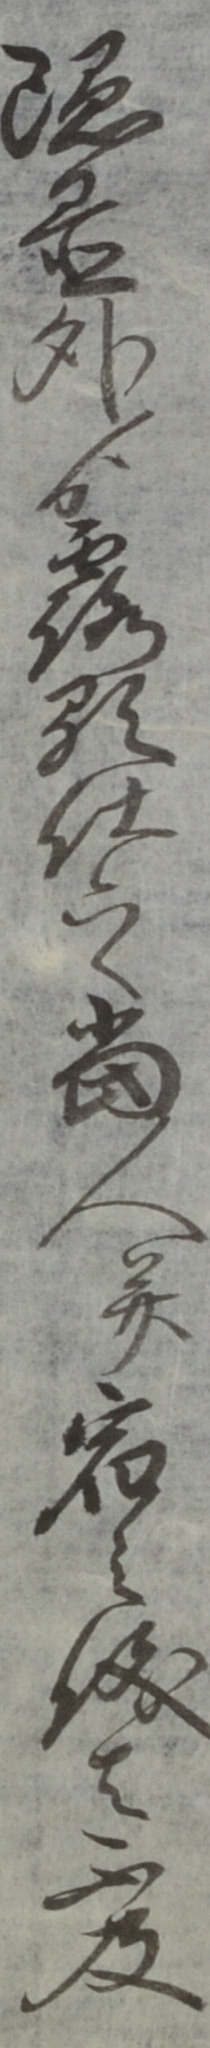隠置外より露顕仕候ハゝ当人幷宿之儀者不及
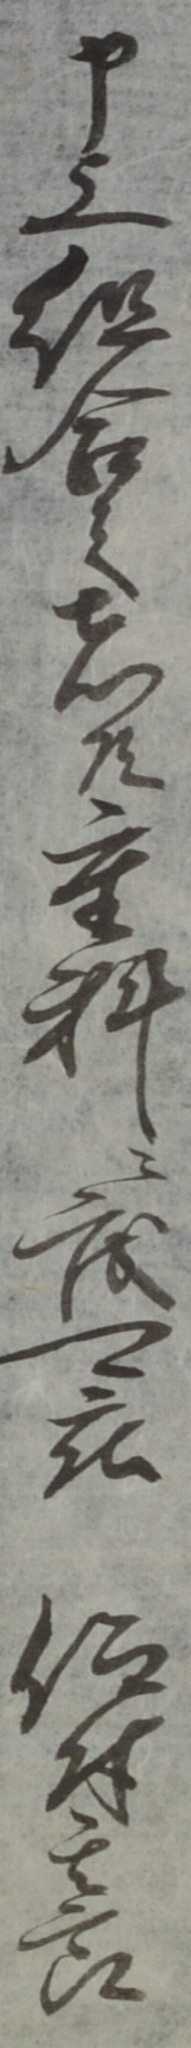申上組合之者共重科ニも可被仰付其節
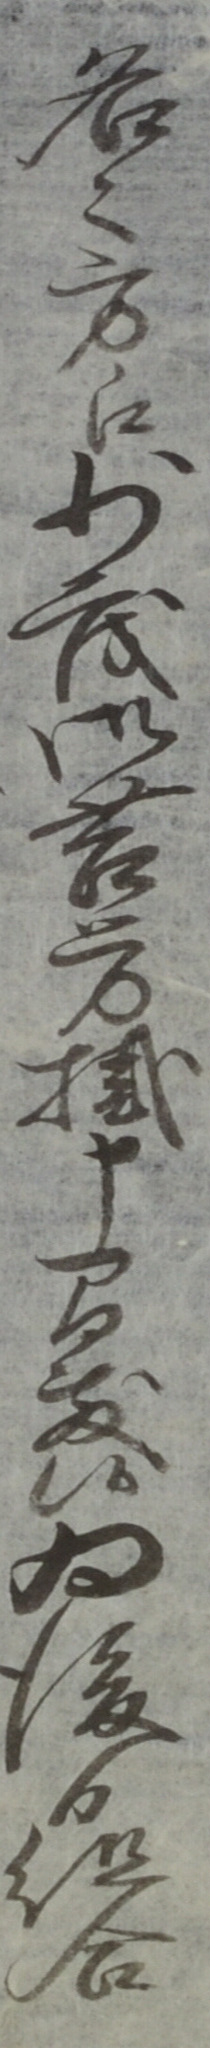各々方え少も御苦労掛申間敷候為後日組合
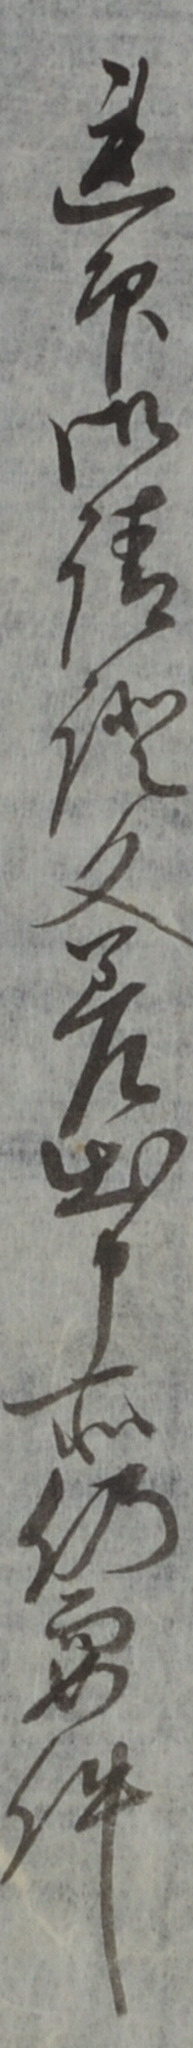連印御請証文差出申所仍而如件
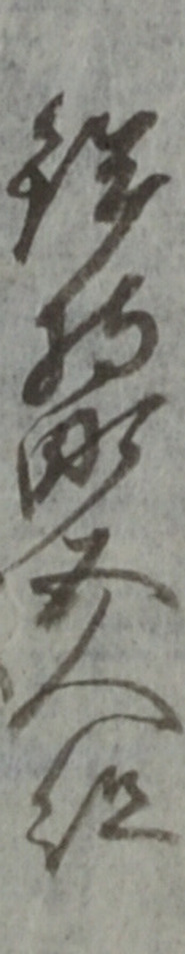鉾持町五人組
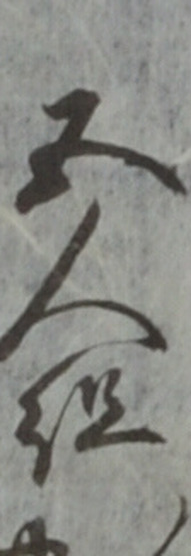五人組
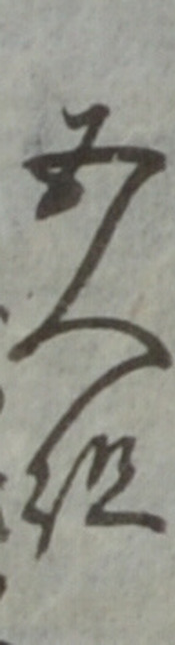五人組

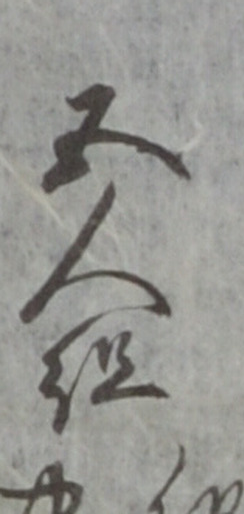五人組
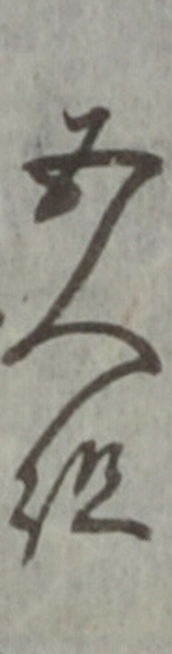五人組
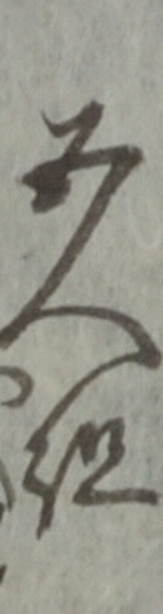五人組
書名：差出申一札之事
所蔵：伊那市立高遠町図書館・合同会社AMANE
